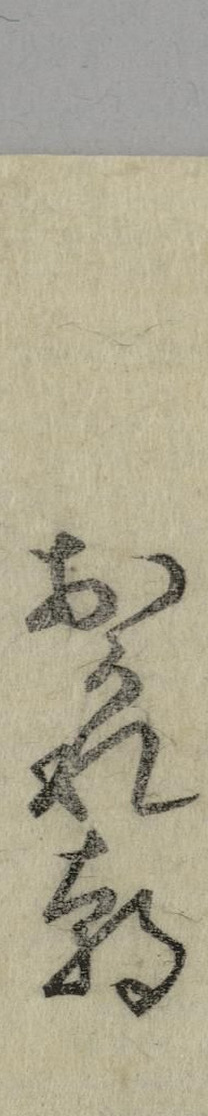おかれ朝
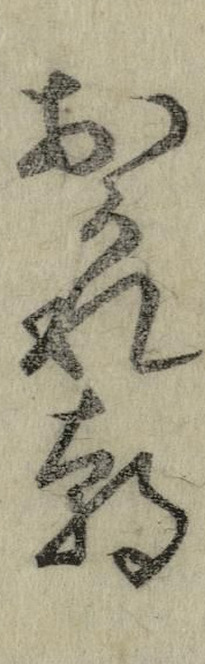おかれ朝
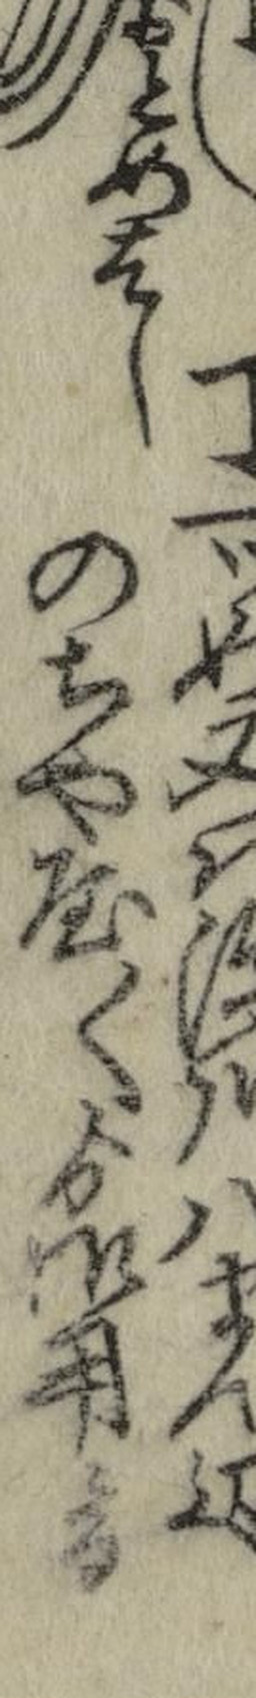のちや屋〳〵ゟ御用立
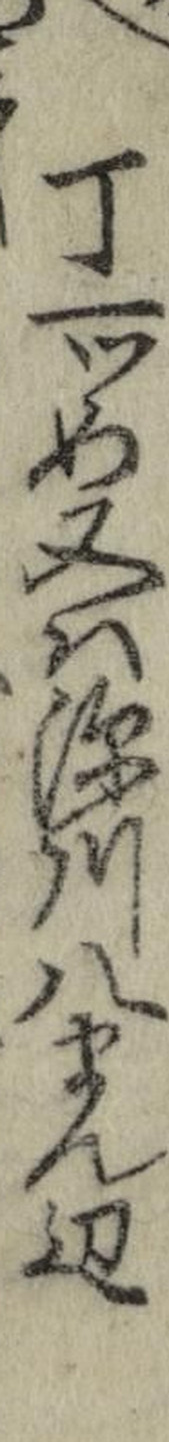丁一ッめ又は深川八まん辺
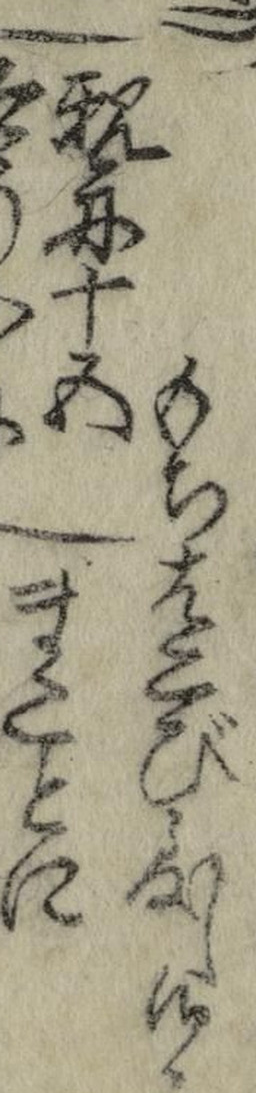まことに
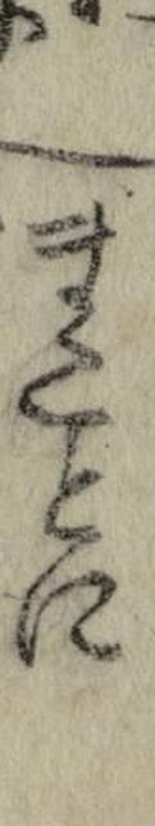まことに
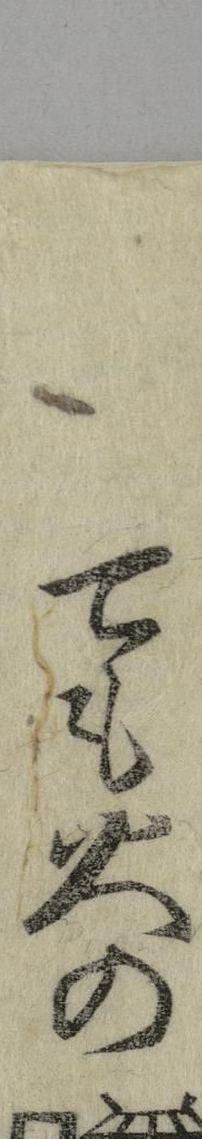ても火の
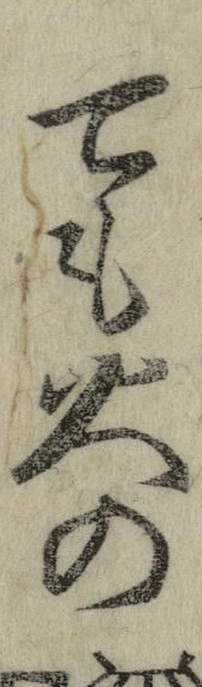ても火の
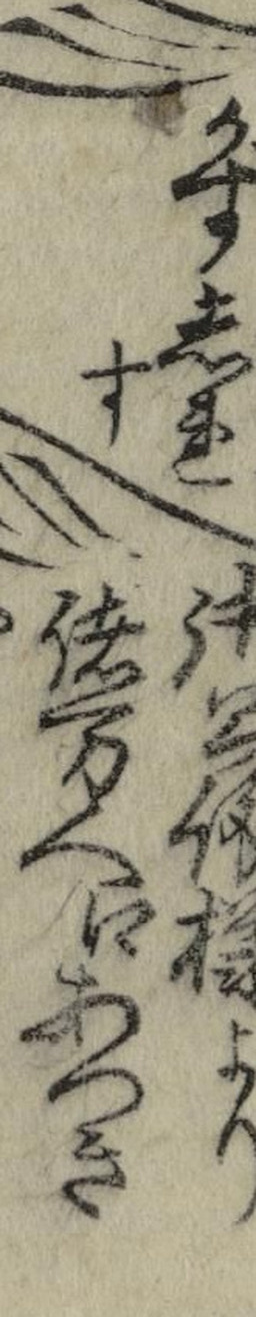諸万人江あつき
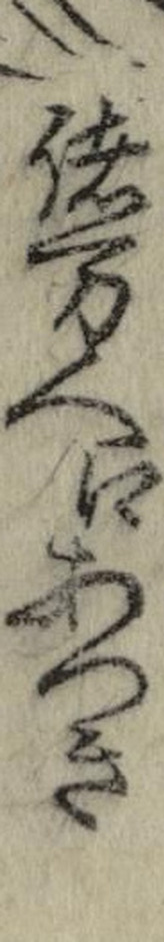諸万人江あつき
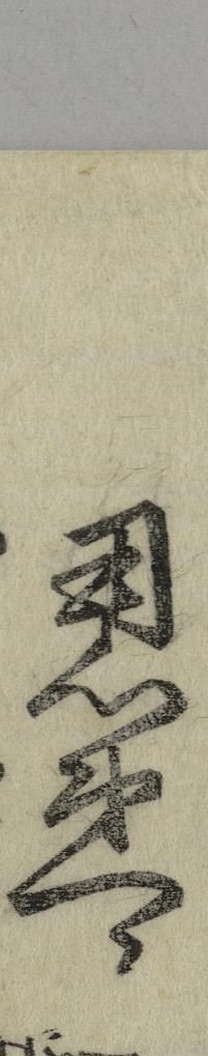用心第一
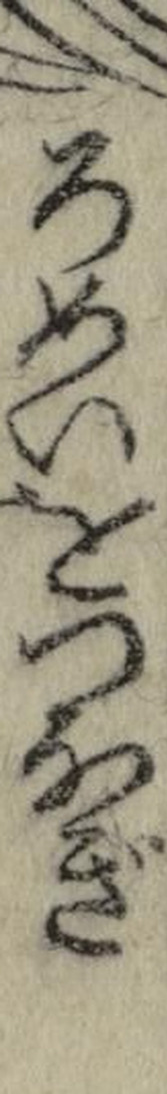ろめいをつなぎ
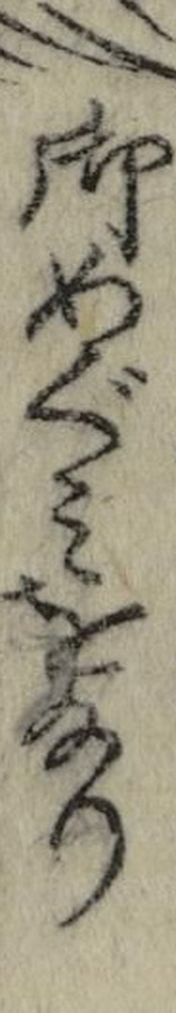御めぐみを給り
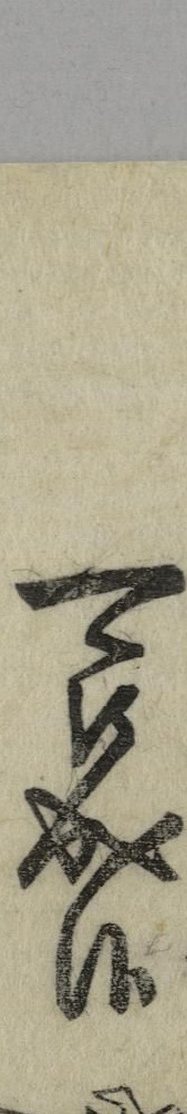可被成候
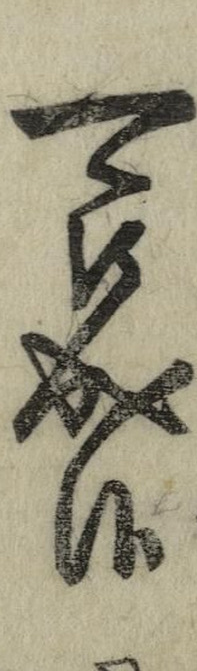可被成候
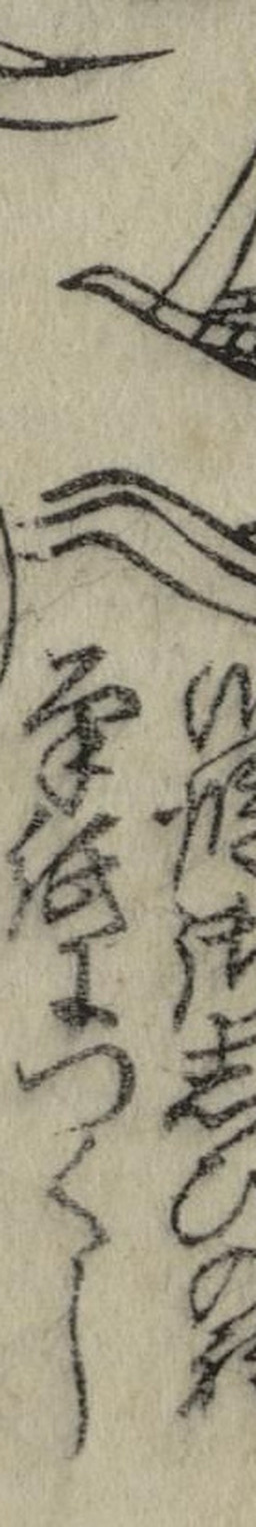筆紙につくし
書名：[文政十二年三月の江戸大火に関する瓦版]
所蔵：東京大学地震研究所図書室 Earthquake Research Institute Library, The University of Tokyo, JAPAN
